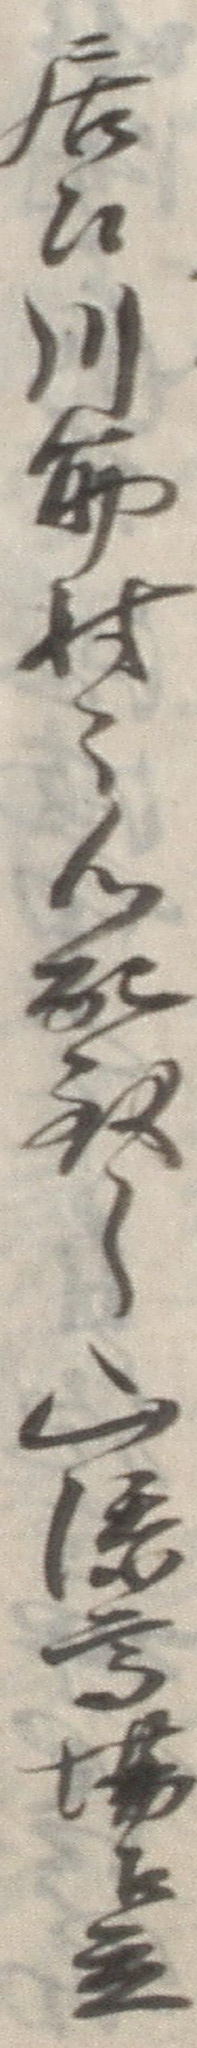居候川筋村々心配致ㇱ山添高場江立
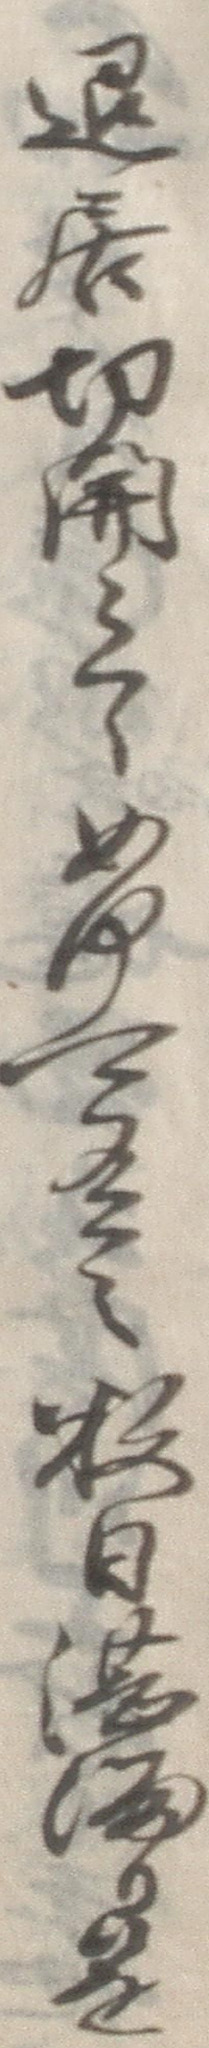退居切開候ハゝ如何可有之数日湛溜候を
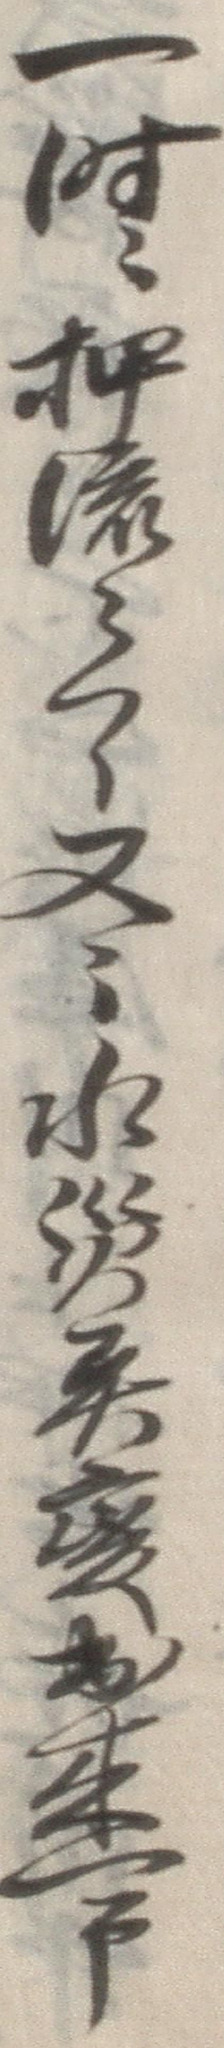一時二押流候ハゝ又々水災異変出来可申
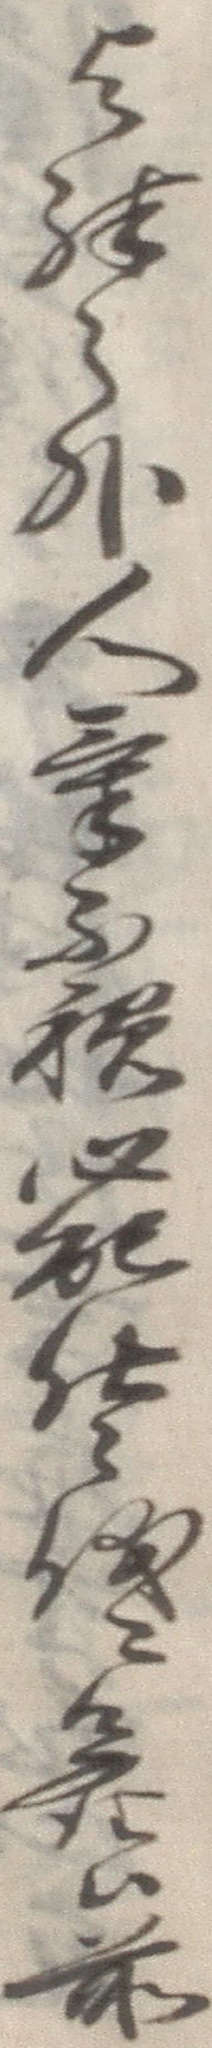と殊之外人気不損心配仕候儀二御座候前
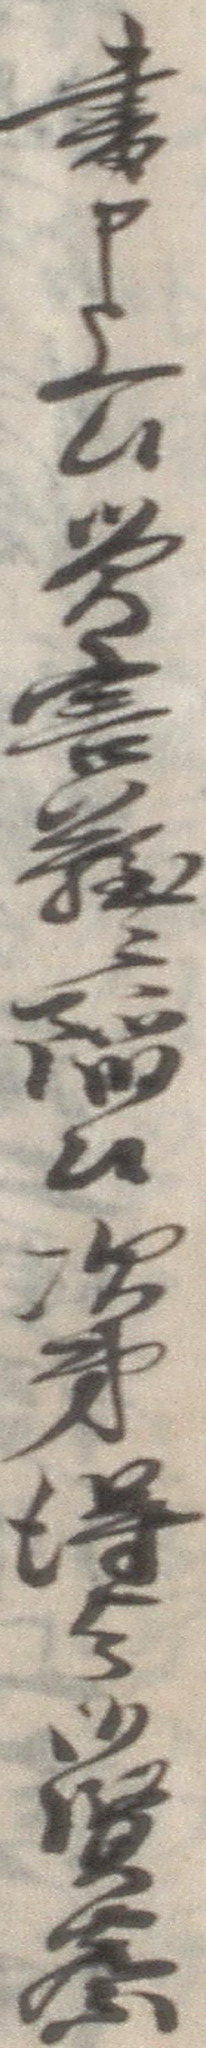書申上候災害難二陥候次第得と御賢察
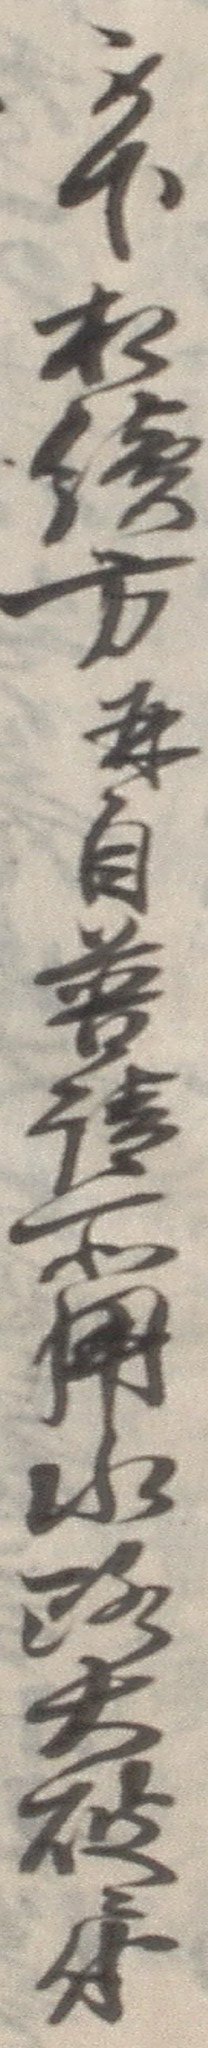被下相続方并自普請所用水路大破二付
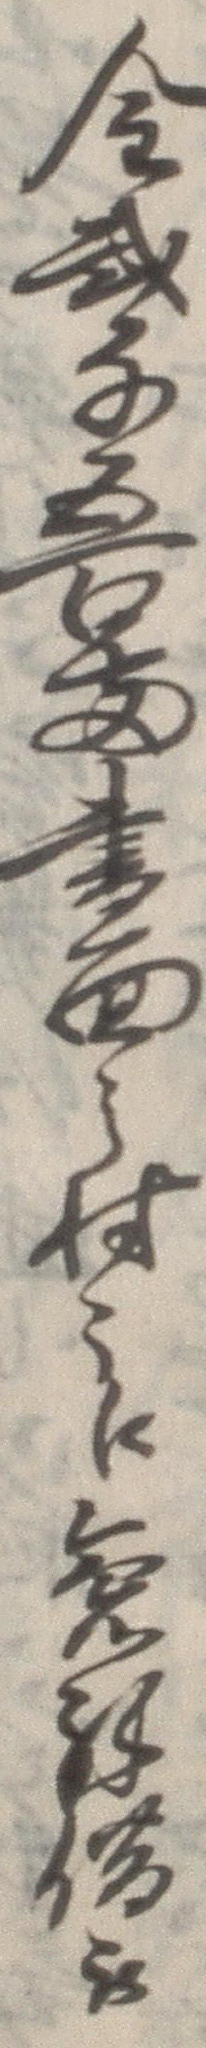金弐千五百両書面之村々江急拝借被
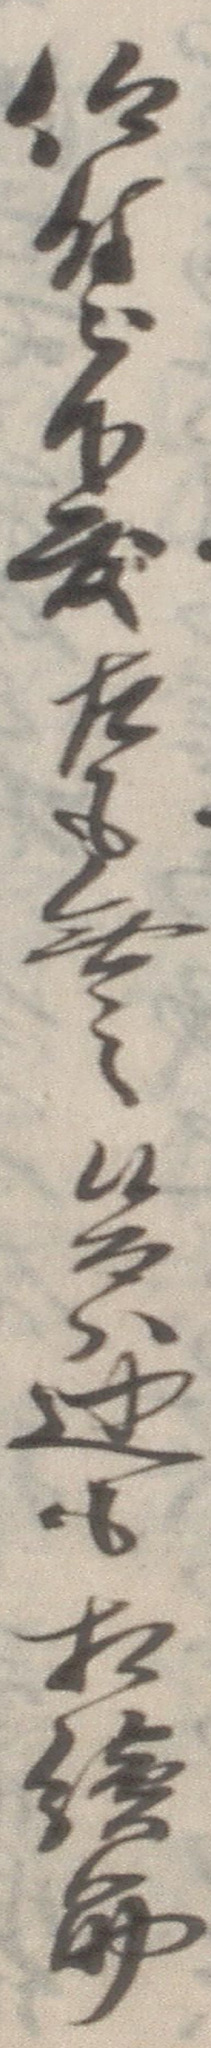仰付被下度左も無之候而ハ迚も相続筋
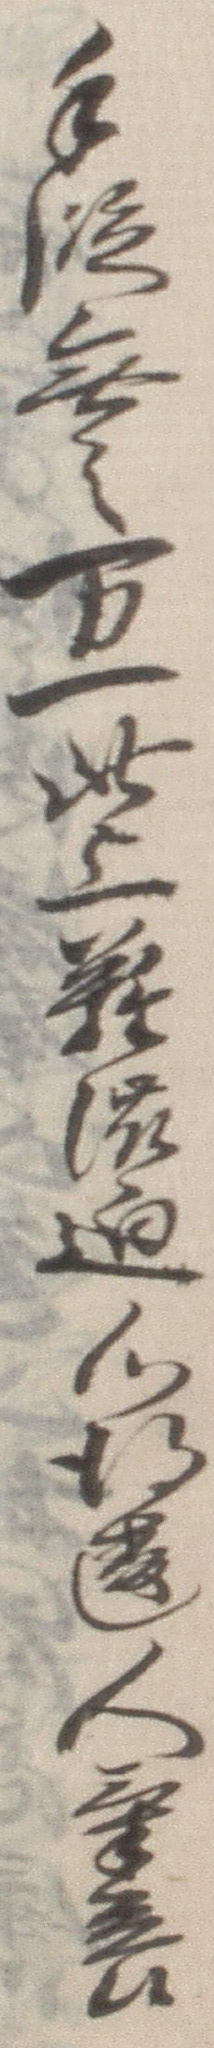手段無之万一此上難渋迫心得違人気立候
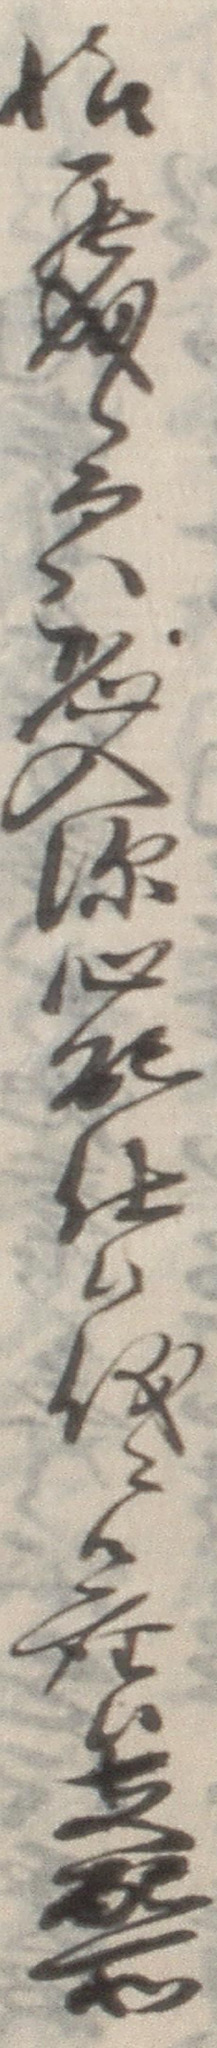様被成候而ハ恐入深心配仕候儀二御座候支配所
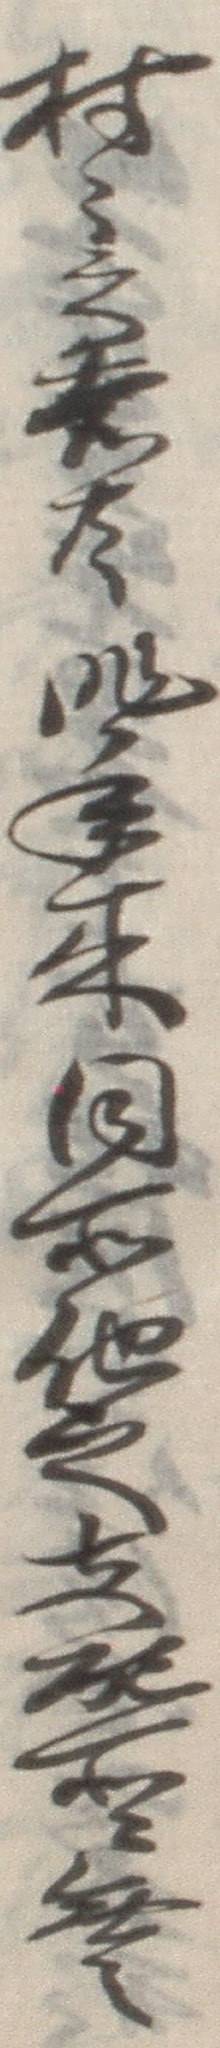村々之者共昨年来同所他之支配所二無之
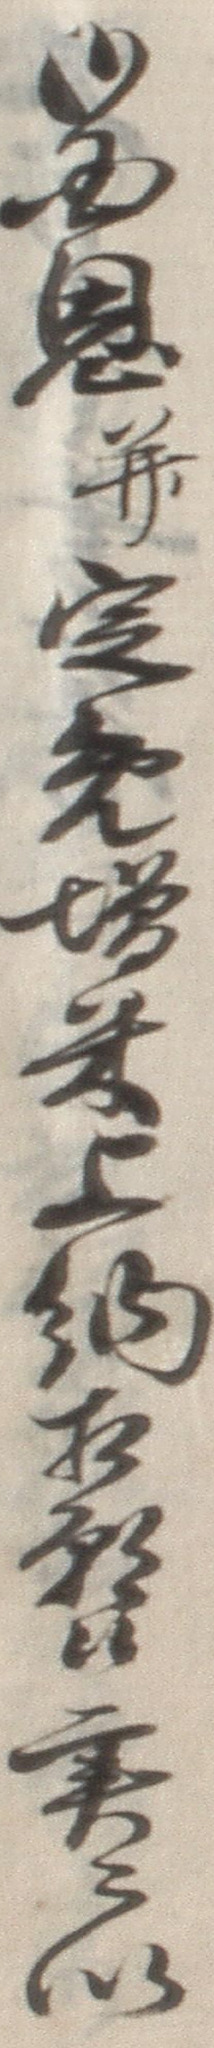御国恩并定免増米上納相願候実二以
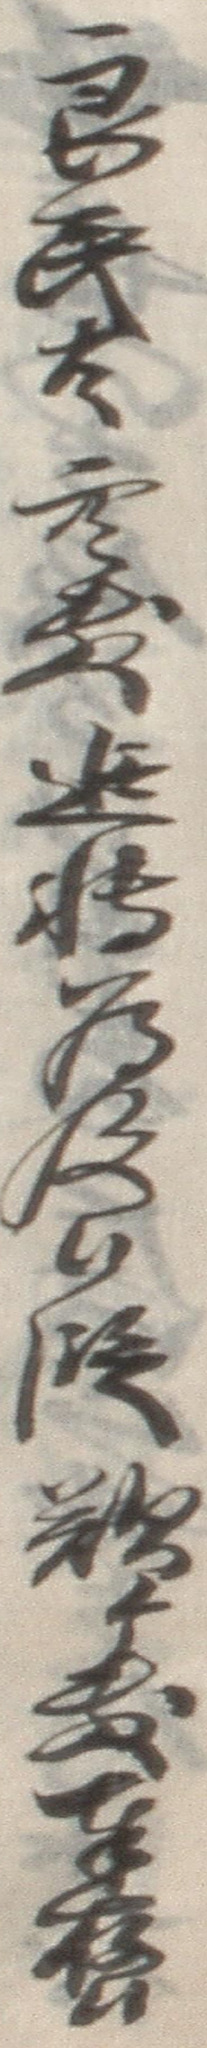良民共空敷退転為及候段歎ヶ敷奉存候
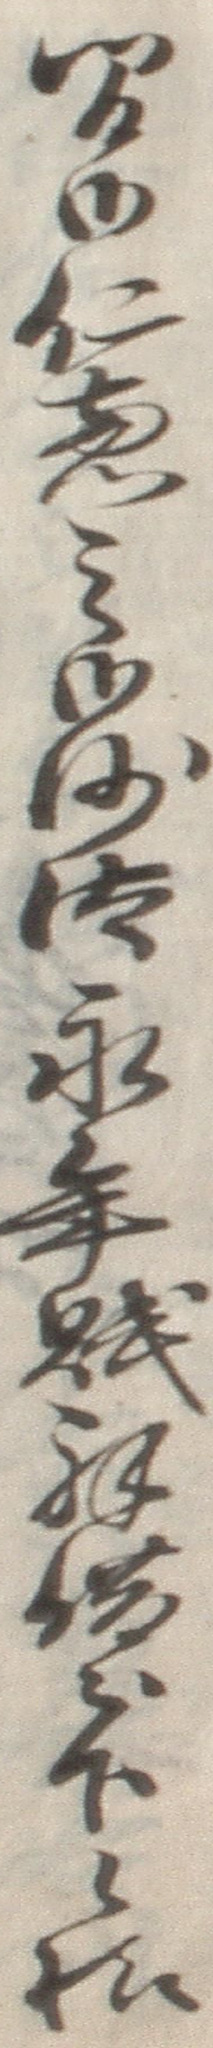間御仁恵之御沙汰永年賦拝借被下候様
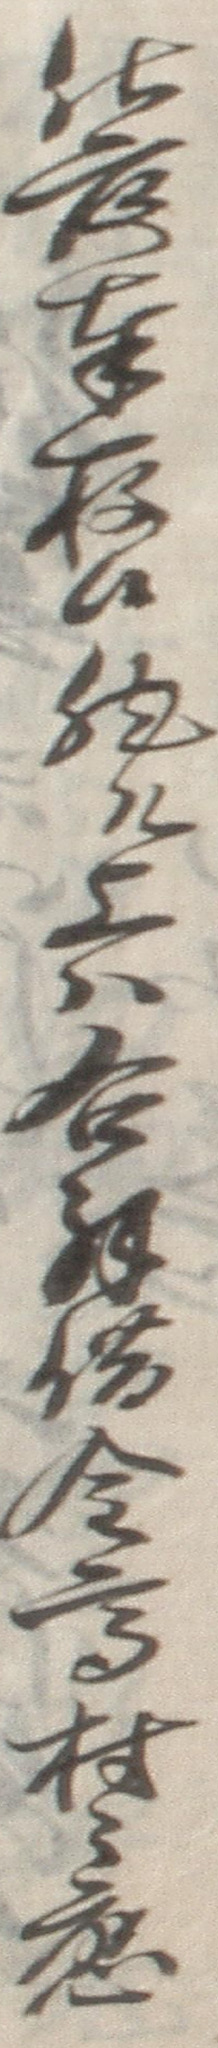仕度奉存候然ㇽ上ハ右拝借金高村々応
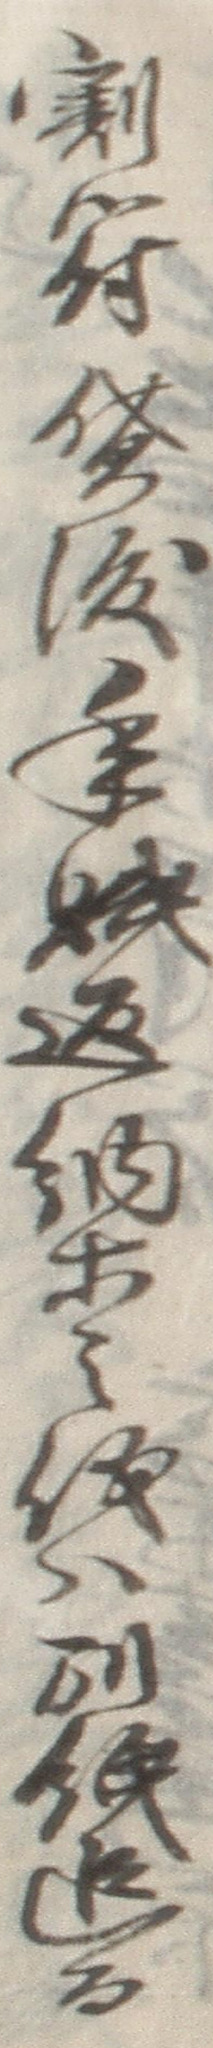割符貸渡年賦返納等之儀ハ別紙追而
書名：信州地震一件
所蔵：東京大学地震研究所図書室 Earthquake Research Institute Library, The University of Tokyo, JAPAN
